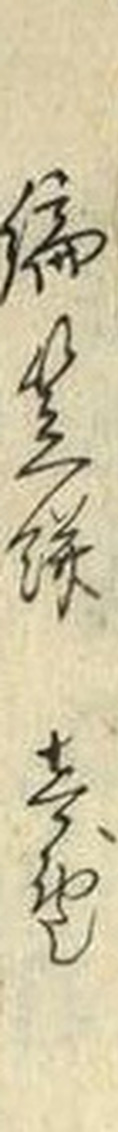編笠餅壱台
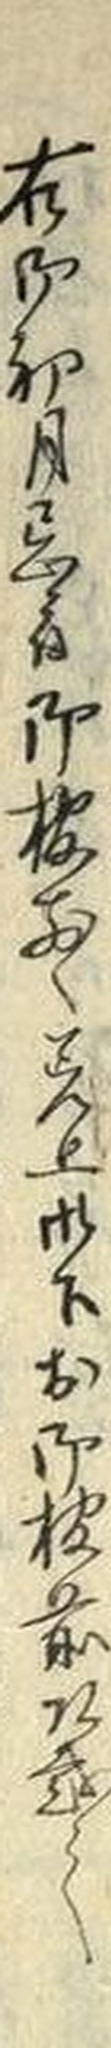右御初月忌ニ付御棺前へ差上御下於御棺前頂戴之
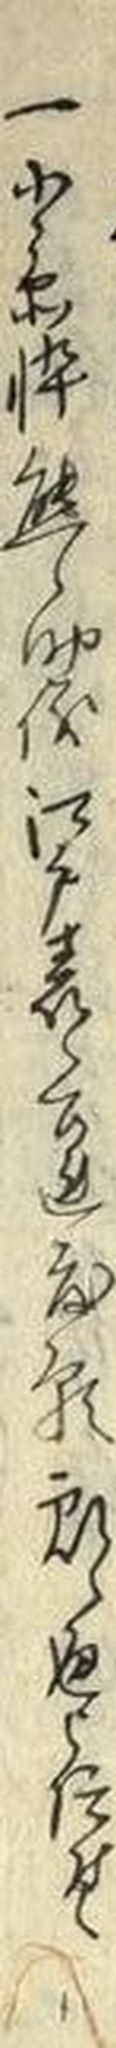一小兵衛伜熊之助儀江戸表へ被召連度願願之通被仰付候
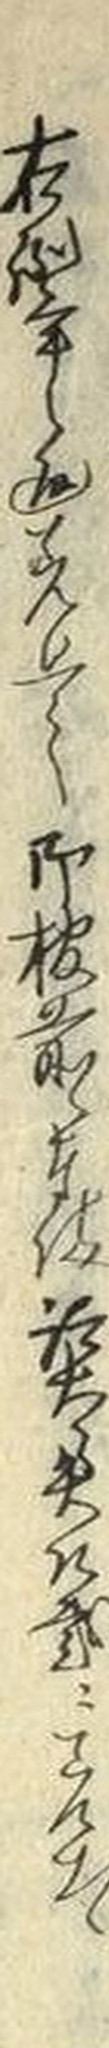右例年之通差上之御棺前へ奉備跡大奥頂戴ニ差出候
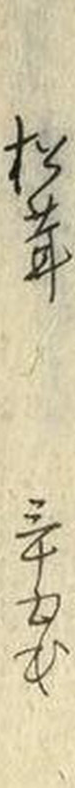松茸三十五本
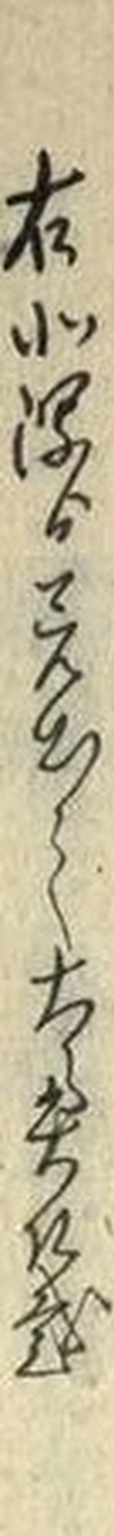右北潟ゟ差出之大奥頂戴
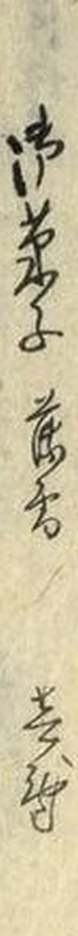御菓子薄雪壱台
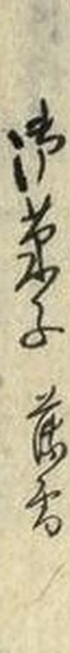御菓子壱箱
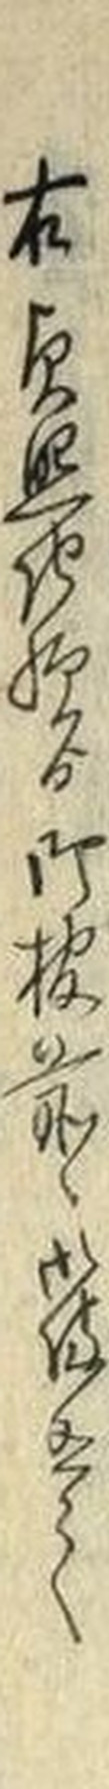右貞照院様ゟ御棺前へ御備有之
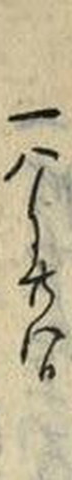一八月廿八日

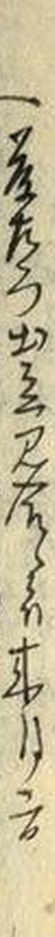藤左衛門出立見合候ニ付来月二日同
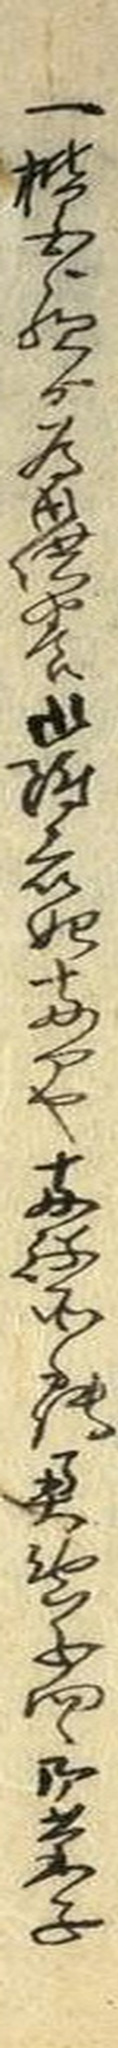一楷五郎様ゟ為御供養御附衆始両部や両役所手伝奥台子向へ御菓子
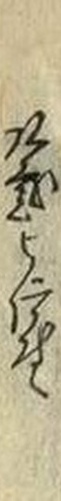頂戴被仰付候
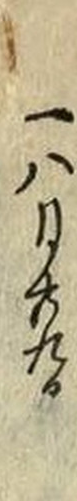一八月廿九日
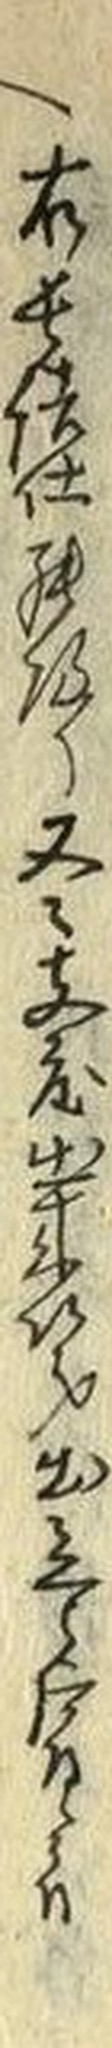右長詰仕罷帰り又々支度出来次第出立被仰付候ニ付本多弥六
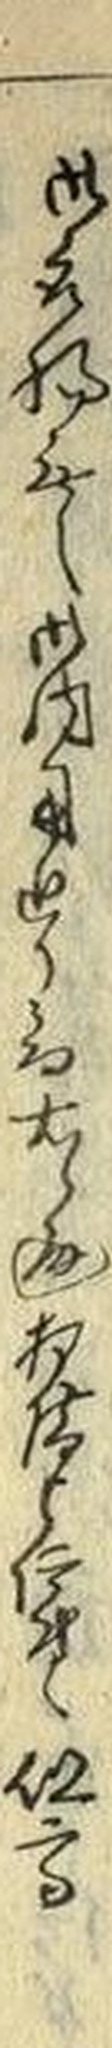御取揚無之御内用廻りニ而右之通拝借被仰付候但高
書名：少傅日録抄（斉善付側向頭取日記、江戸并道中、初入在国、逝去後…
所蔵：福井県文書館 Fukui Prefectural Archives
